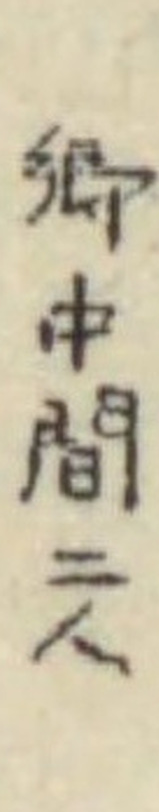御中間二人
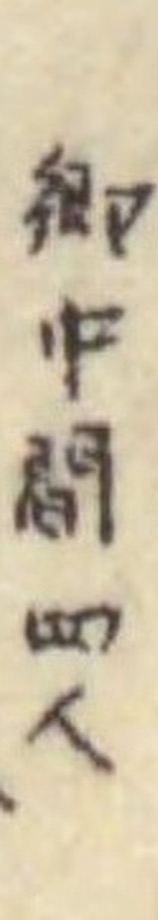御中間四人
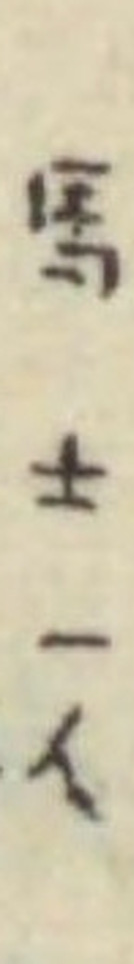馬士一人
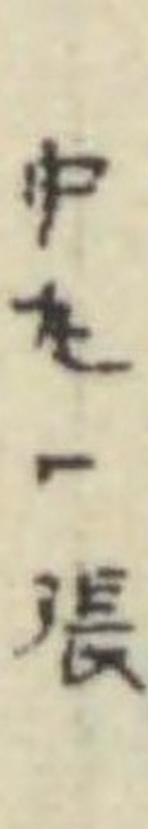中丸一張
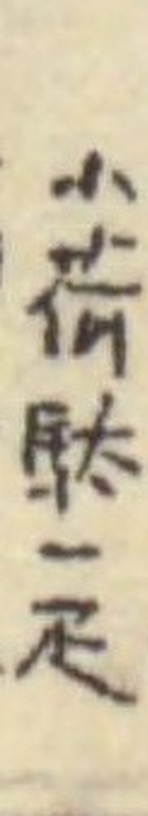小荷駄一疋
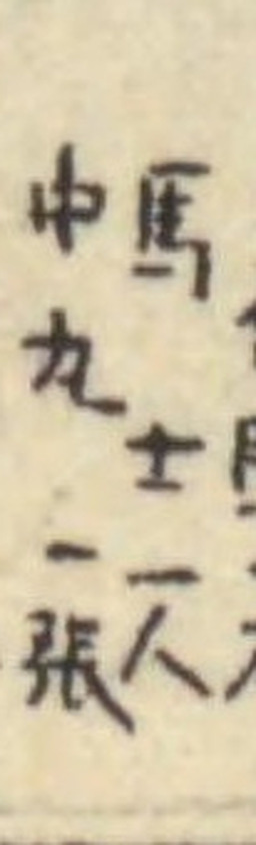中丸一張
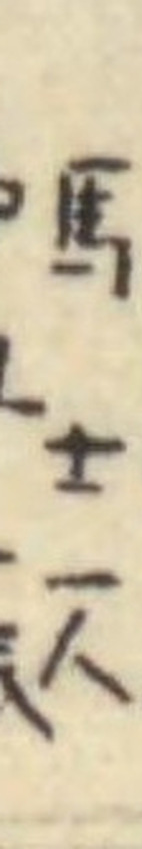馬士一人
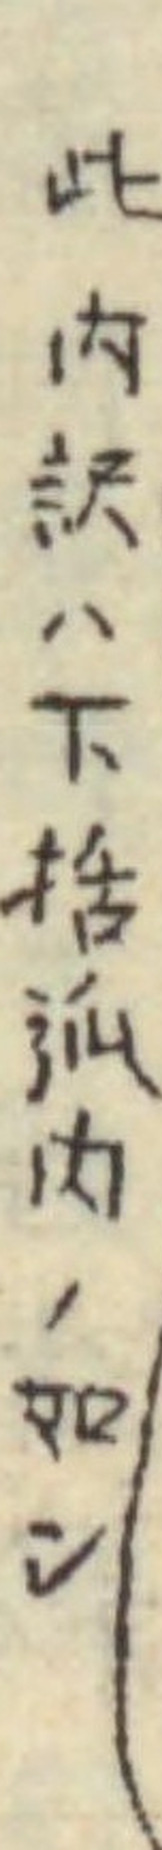此内訳ハ下括弧内ノ如シ
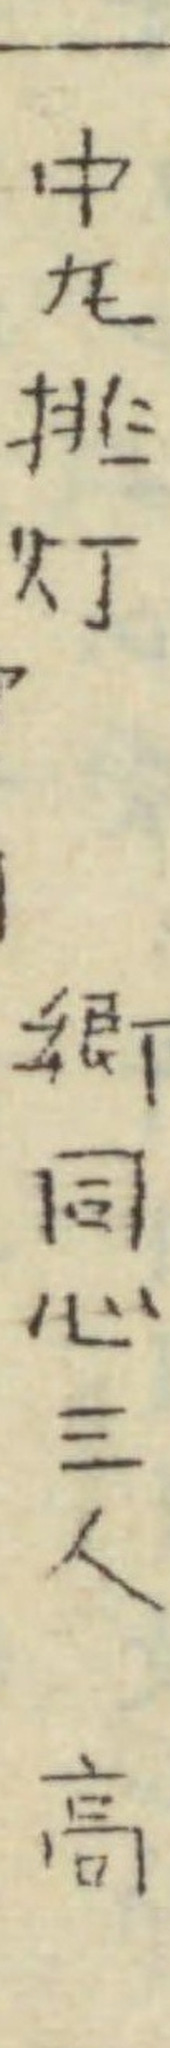中丸挑灯御同心三人高張
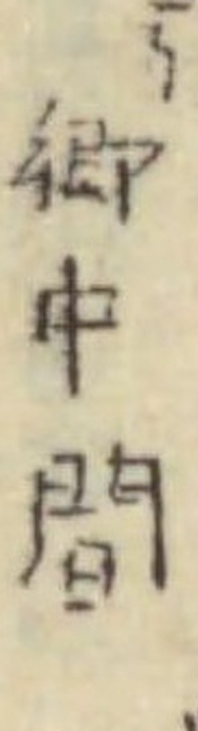御中間
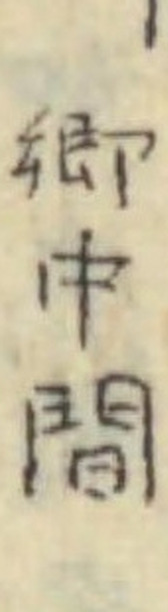御中間
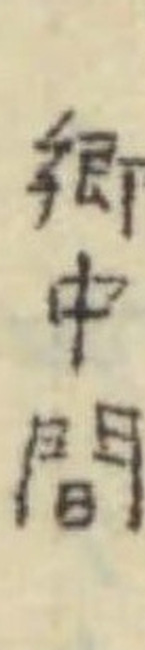御中間
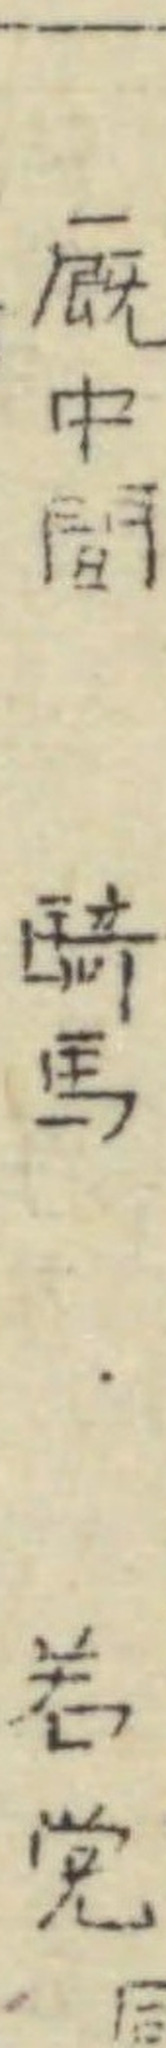厩中間騎馬若党同心
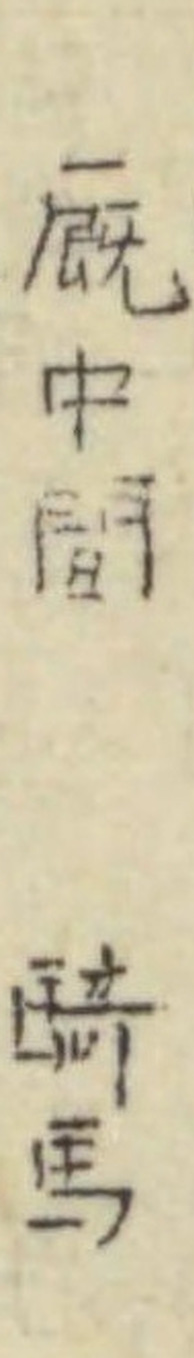厩中間一人
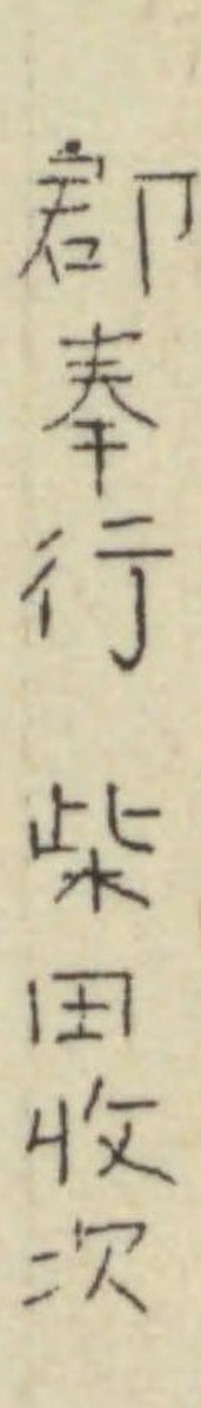郡奉行柴田収次
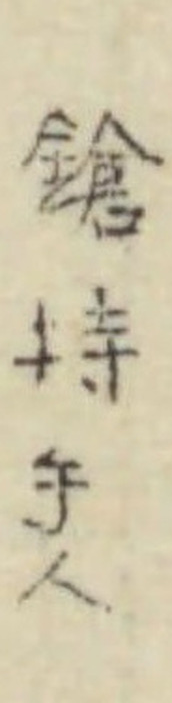鎗持手人
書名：三河吉田藩動員史料
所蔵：国立国会図書館 National Diet Library, JAPAN
